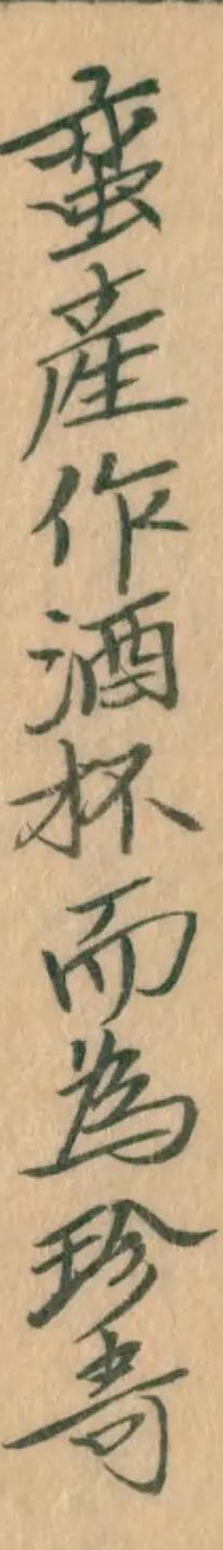蛮産作酒杯而為珍奇
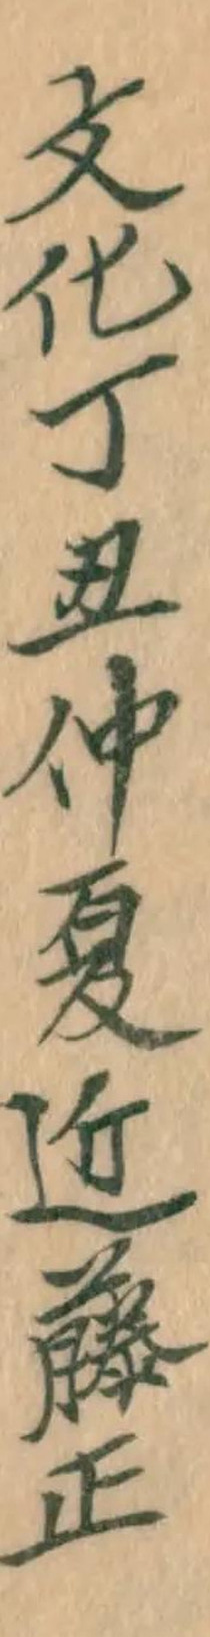文化丁丑仲夏近藤正
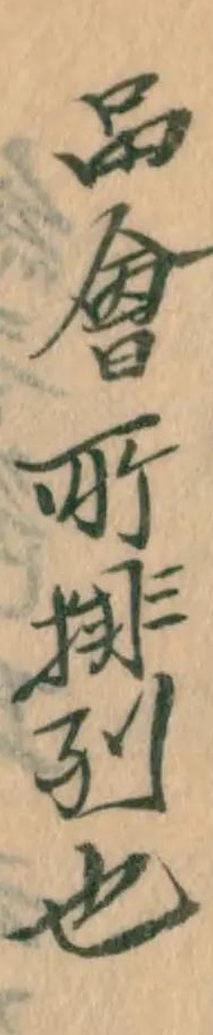品會所排列也

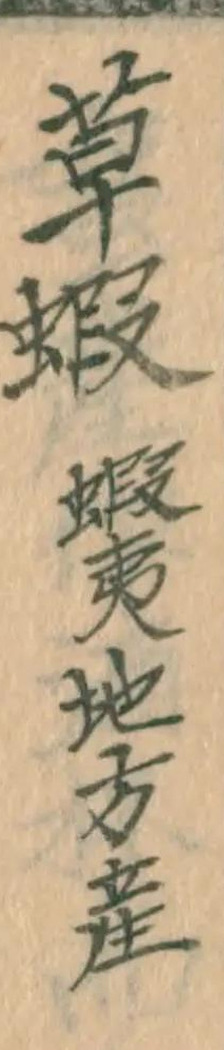草蝦蝦夷地方産
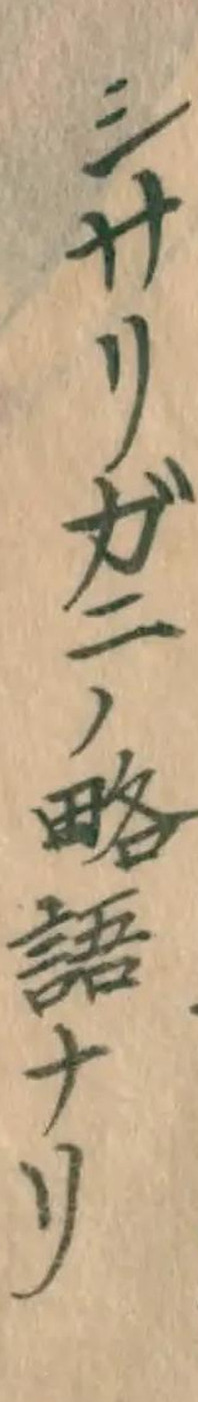シサリガニノ略語ナリ
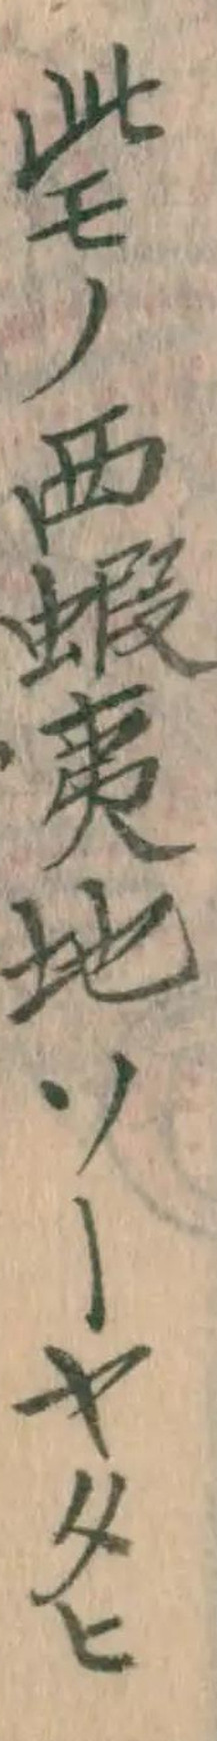此モノ西蝦夷地ソーヤタヒ
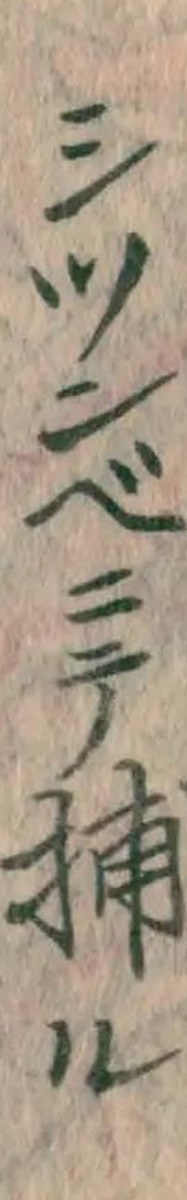シツンベニテ捕ル
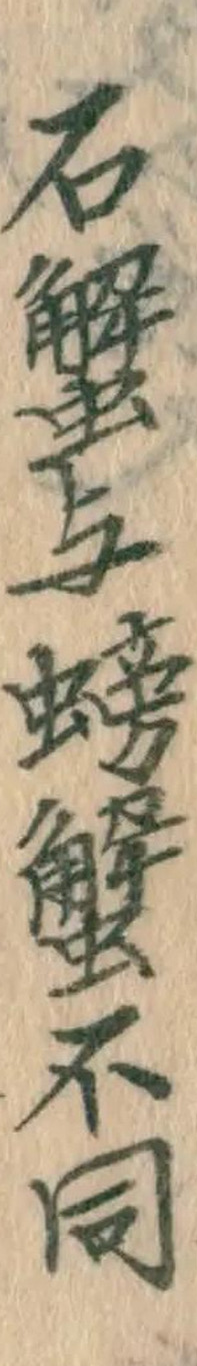石蟹与螃蟹不同
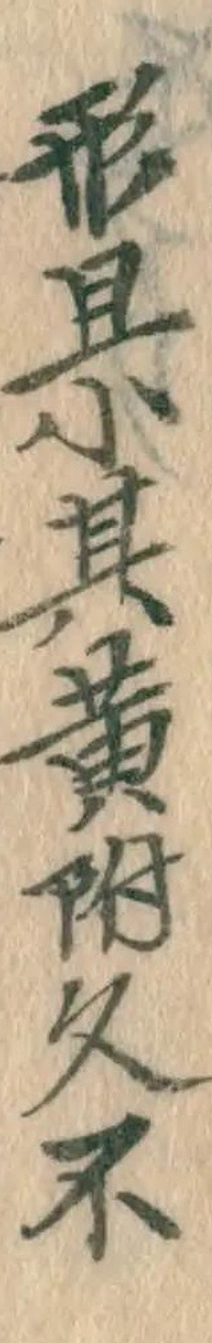形且小其黄附久不
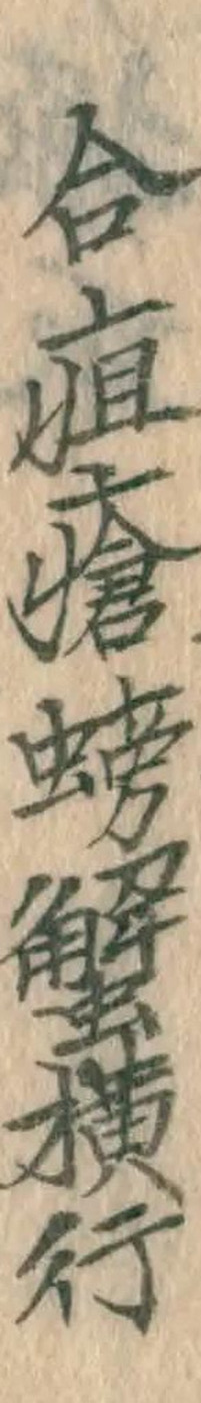合疽瘡螃蟹横行
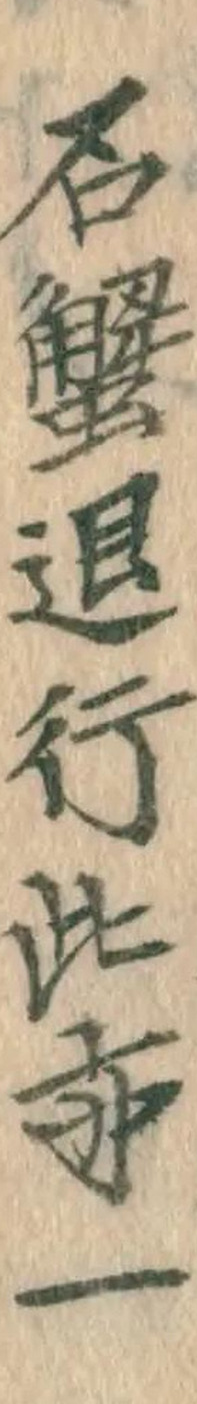石蟹退行此亦一
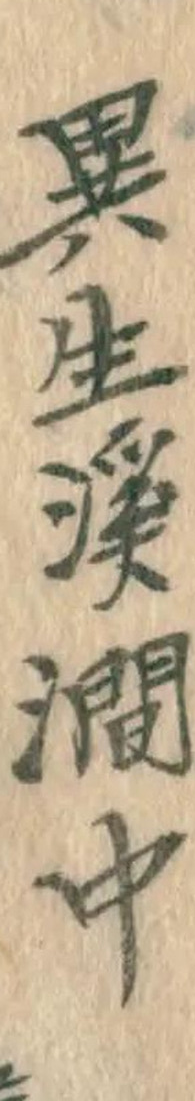異生渓澗中
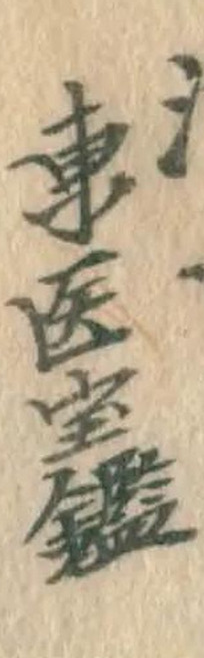東医宝鑑

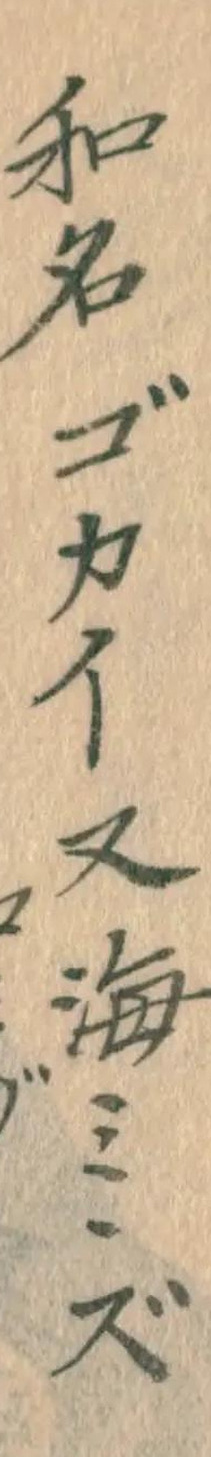和名ゴカイ又海ミヽズ
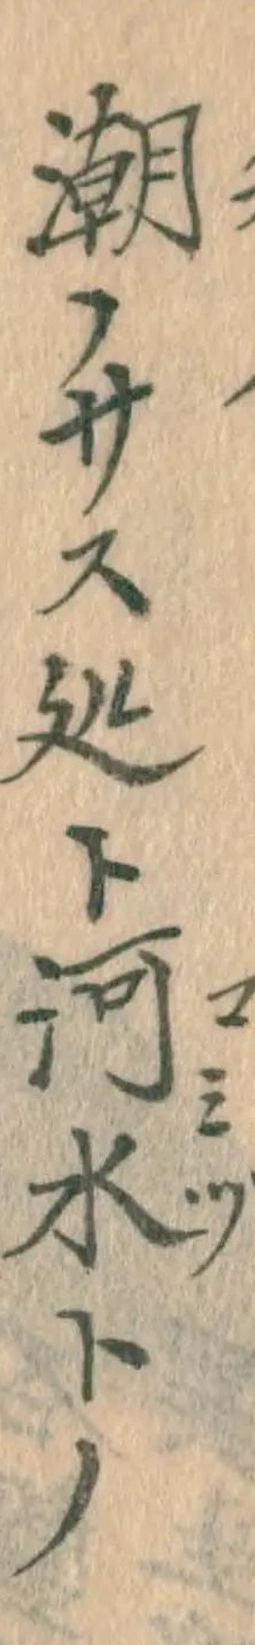潮ノサス処ト河水トノ
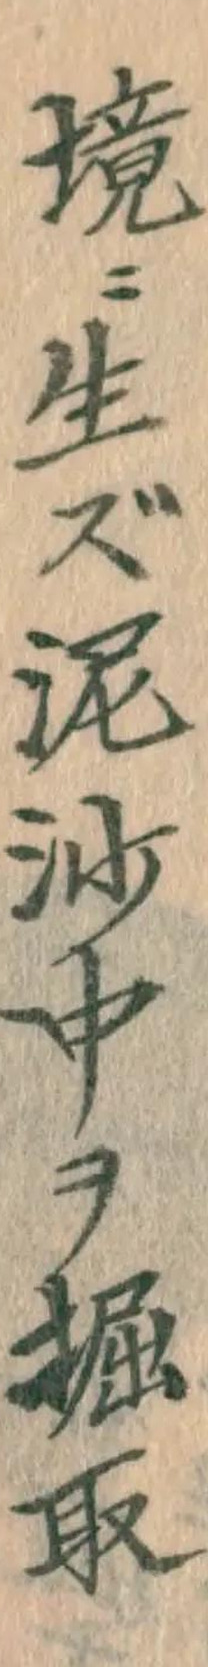境ニ生ズ泥沙中ヲ掘取
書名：千蟲譜 3巻. [2]
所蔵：国立国会図書館 National Diet Library, JAPAN
